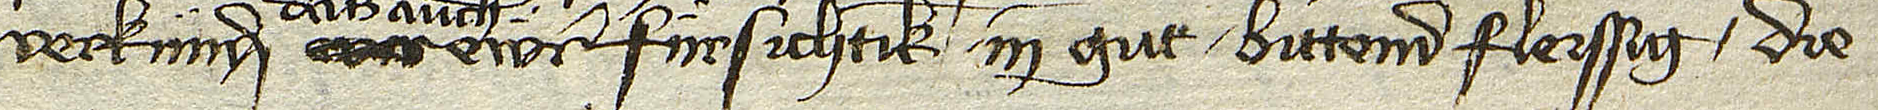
verkünd* wir ewr* fürſichtik* in gut / bittend fleiſſig / die
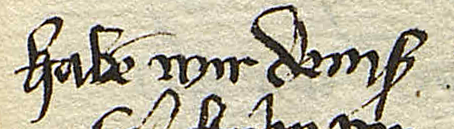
habe* wir demſ*
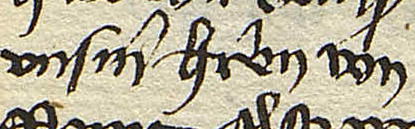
vnſm* hr*en von
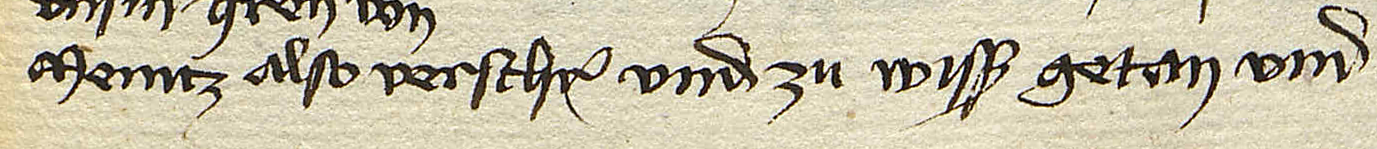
Meincʒ alſo verſchr* vnd ʒu wiſſ* getan vnd
